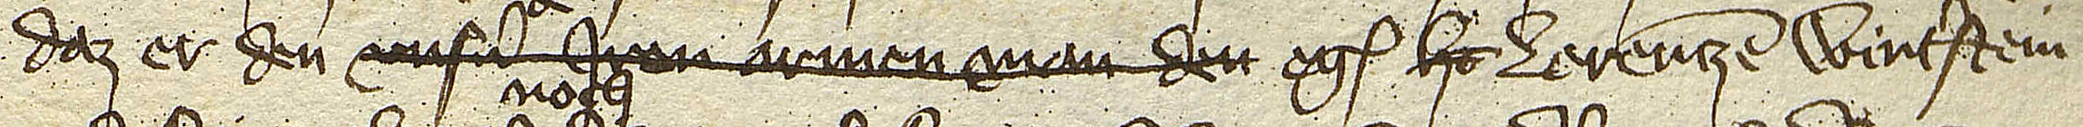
daʒ er den vnſn* Iren armen man den eg* h Lorencʒe* wint*ſtein
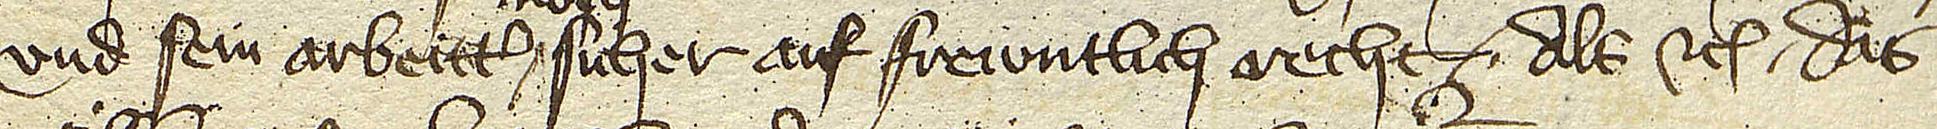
vnd ſein arbeitt* ſicher auf frewntlich recht / . Als ec* / das
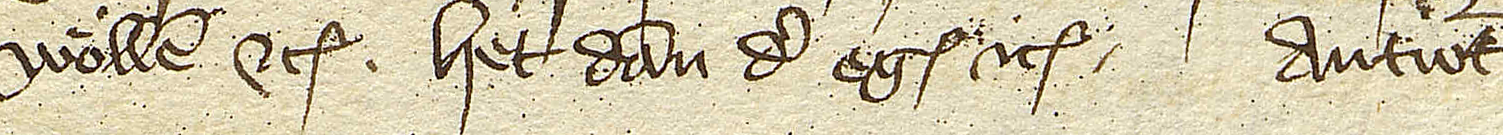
wölle* ec* . het dan* d* eg* ec* / Antw*t
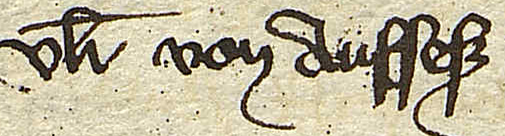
vlr* von Aufſeſʒ
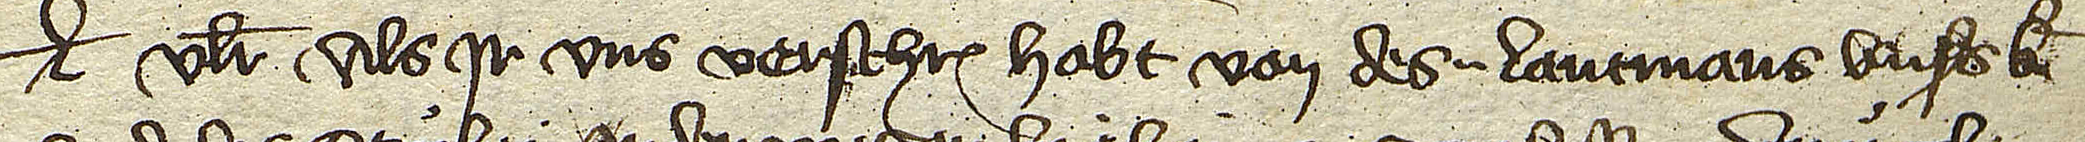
L* vlr* / Als Ir vns verſchr* habt von des ~ lantmans vnſ*s b*
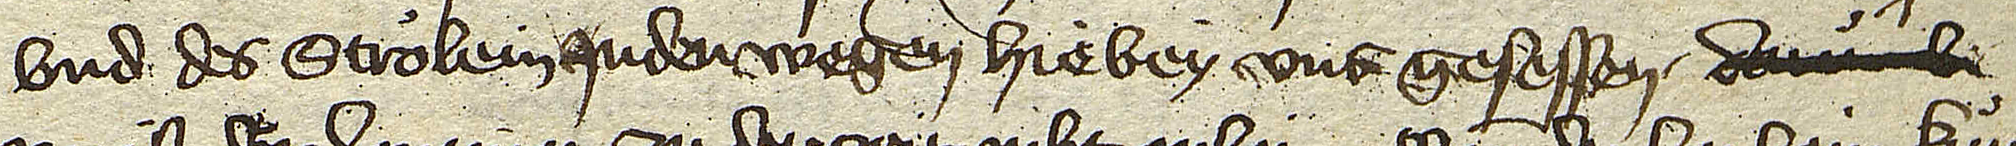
vnd des Strölein Iuden wegen hie bey vns geſeſſen / darümb
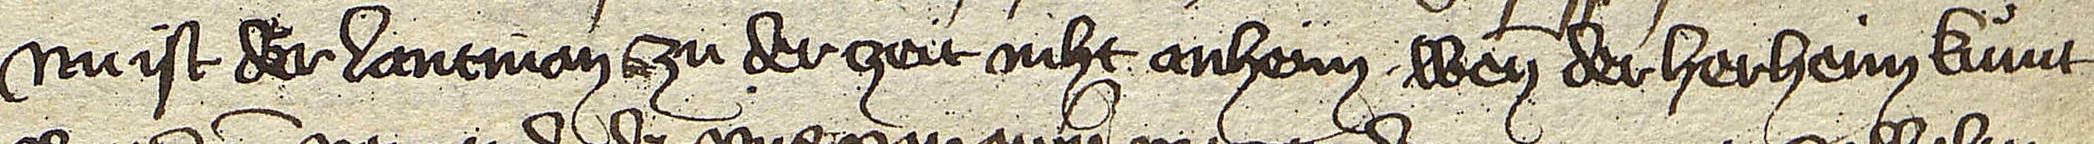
Nu iſt der lantman cʒu der cʒeit niht anheim / wen* der herheim kümt
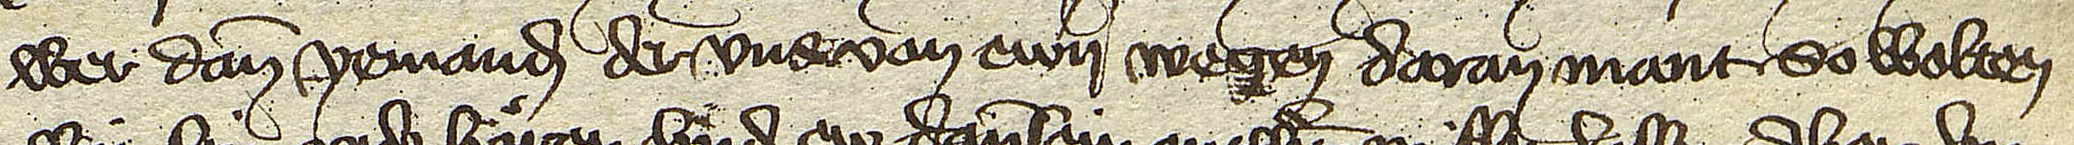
wer dan* yemand* der vns von ewn* wegen daran mant / So wolten
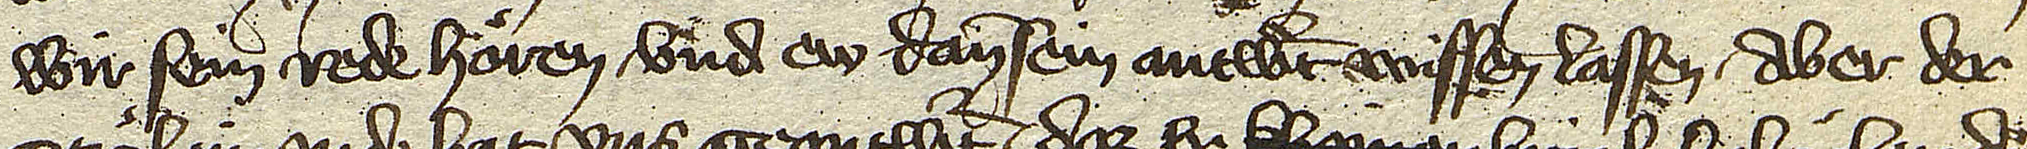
wir ſein rede hören / vnd ew dan* ſein antw*t wiſſen laſſen / Aber der
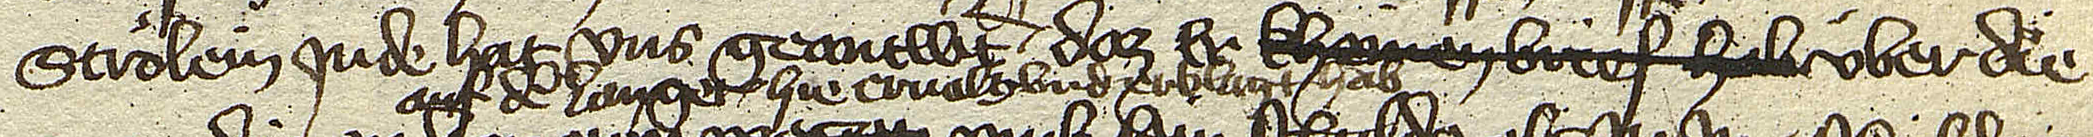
Strölein Iude hat vns geantw*t / daʒ Er kheinen brief hab v̈ber die
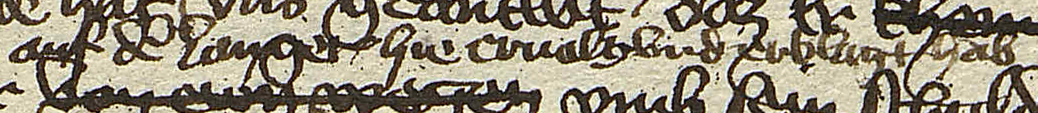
auf d* Langer* hie eruolt vnd erklagt hab
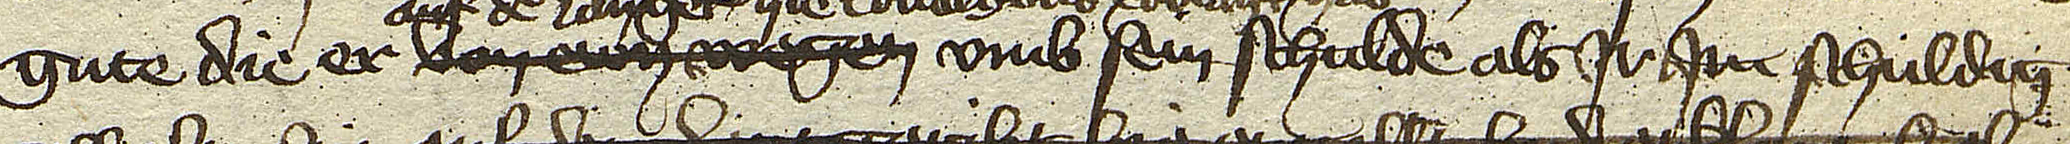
gute die er von ewn* wegen v̈mb ſein ſchulde als Ir Im ſchuldig
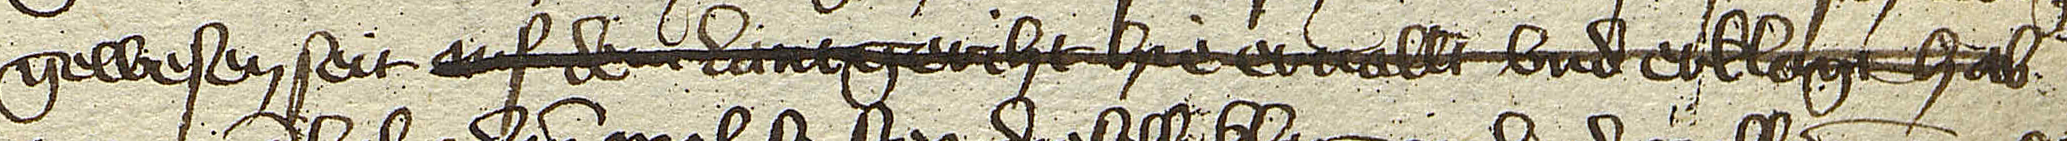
geweſen ſeit auf dem lantgeriht hie eruollt vnd erklagt hab
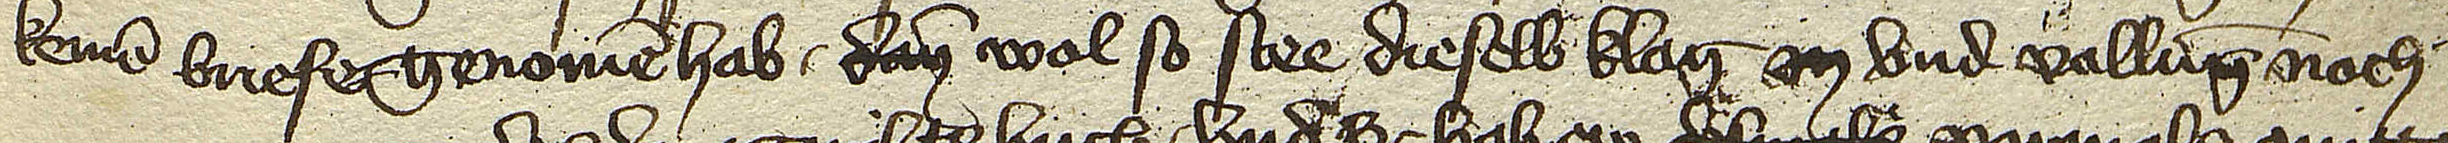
keine* briefe genome* hab / dan* wol ſo ſtee dieſelb klag in vnd vallug* noch
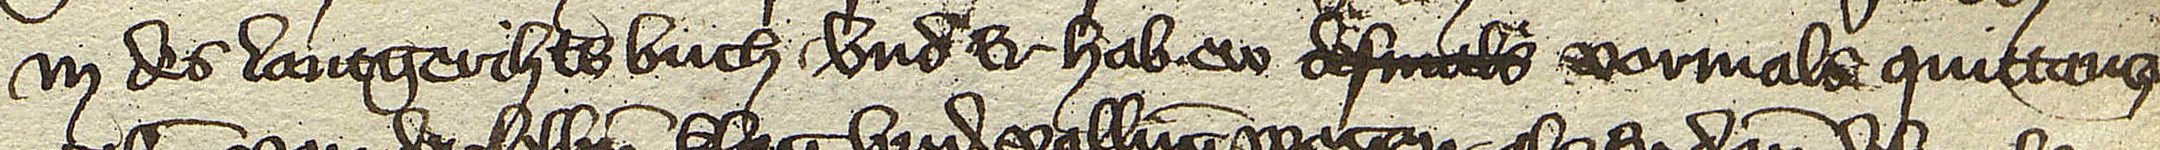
in des lantgerihts buch / vnd Er hab ew deſmals vormals quittancʒe*
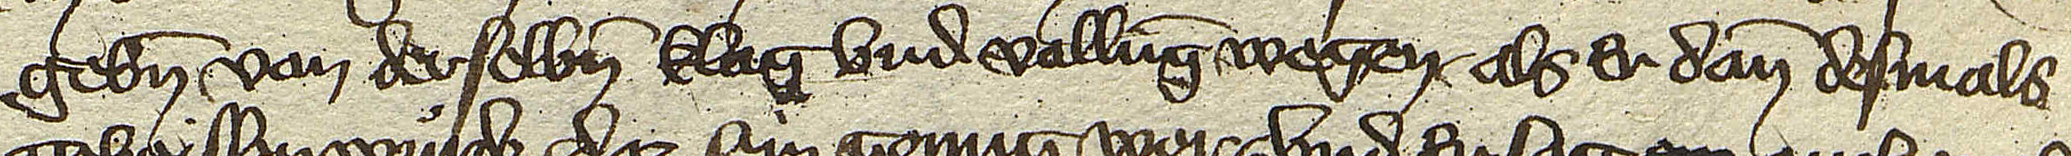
gebn* von derſelbn* klag vnd vallug* wegen / als Er dan* deſmals
